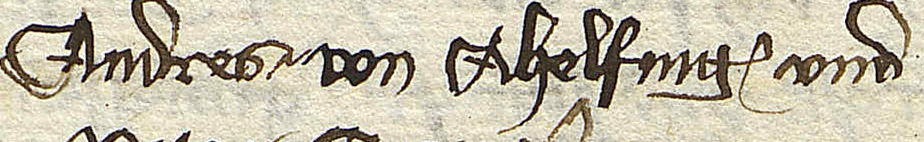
Andres / von Ahelfing* vnd
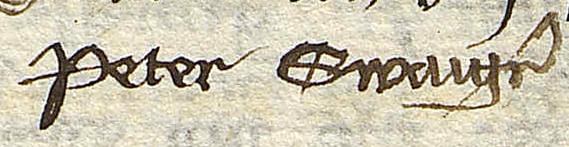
Peter Swaigr*
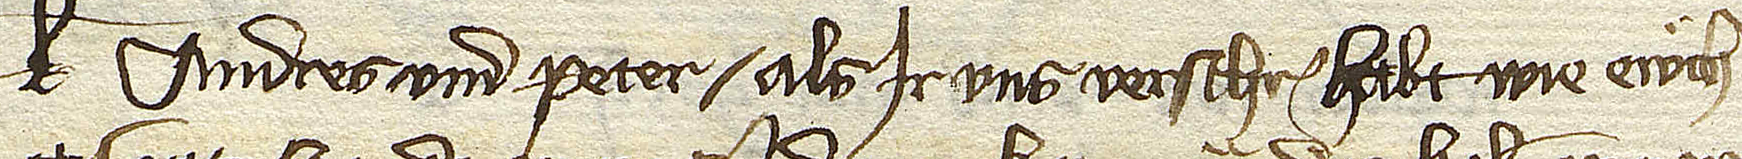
L* Andres vnd Peter / als Ir vns verſchr* habt wie ewch
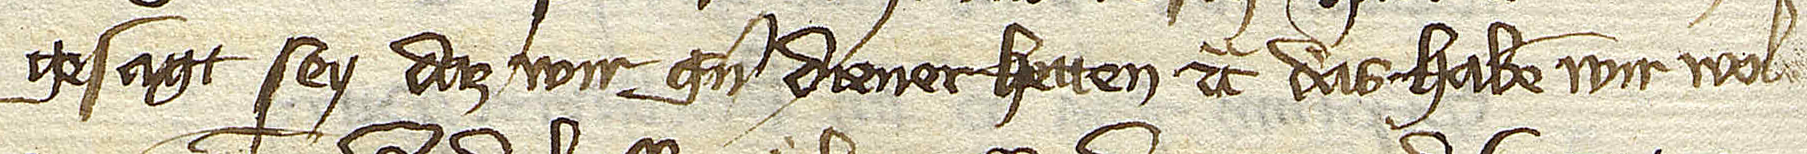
geſagt ſey daʒ wir gn* diener hetten ec* das habe* wir wol
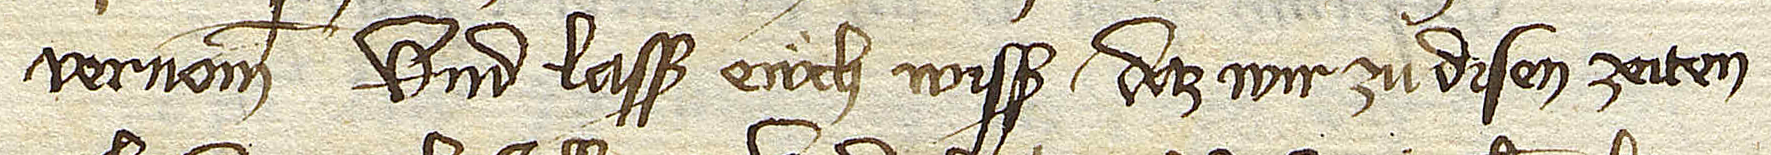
vernom* Vnd laſſ* ewch wiſſ* / das wir ʒu diſen ʒeiten
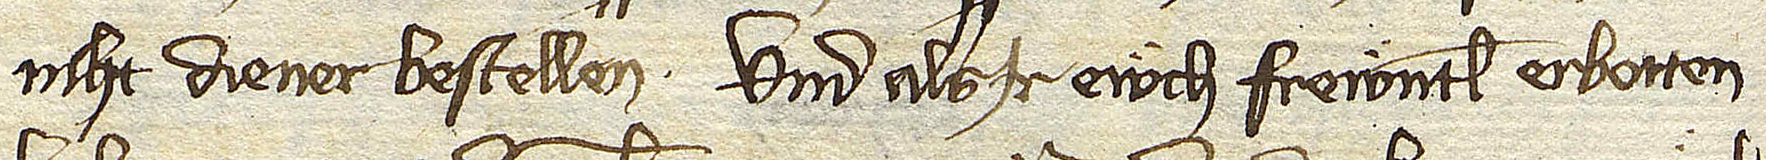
niht diener beſtellen . Vnd als Ir ewch frewntl* erbotten
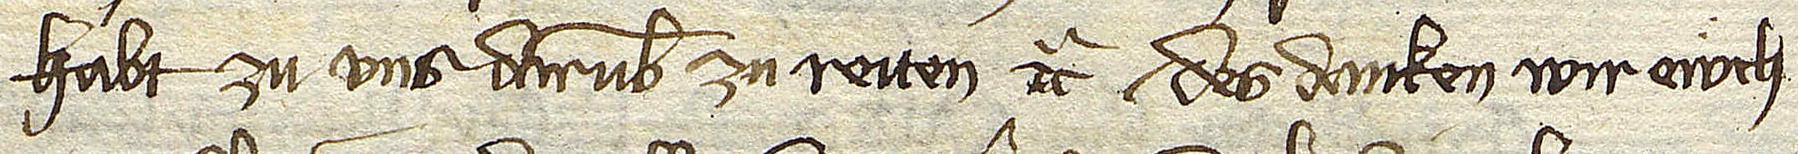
habt ʒu vns darub* ʒu reiten ec* / Des danken wir ewch
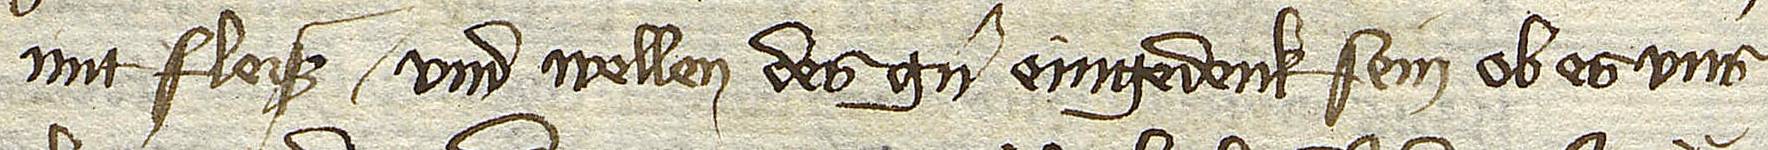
mit fleiſʒ / vnd wellen des gn* eingedenk ſein ob es vns
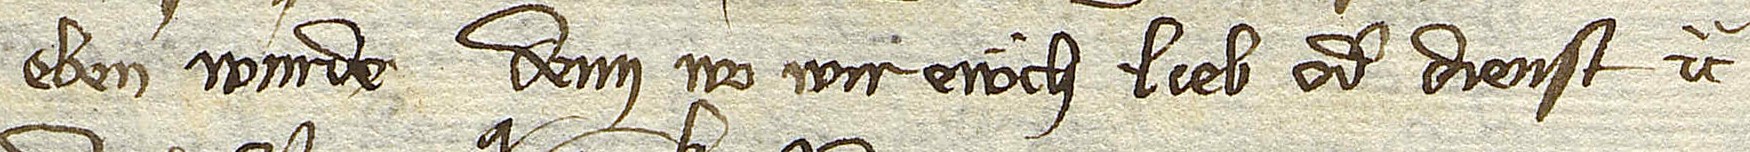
eben wurde Denn wo wir ew lieb od* dienſt ec*
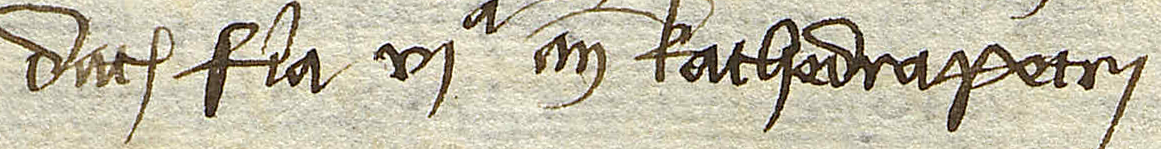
Dat* fi*a vi* an* kathedra Petri
